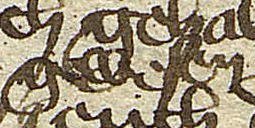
geweſen
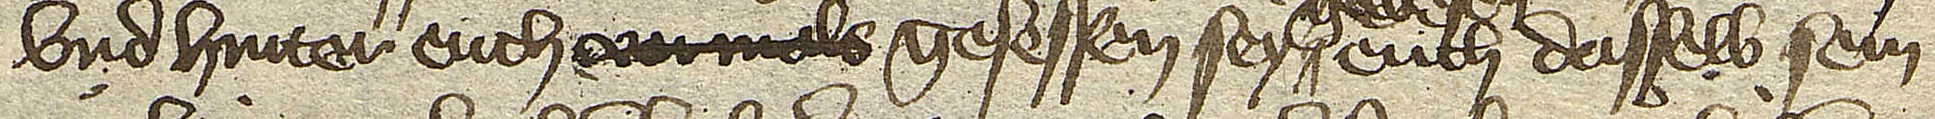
vnd hinter euch vormals geſeſſen ſey euch daſſelb ſein
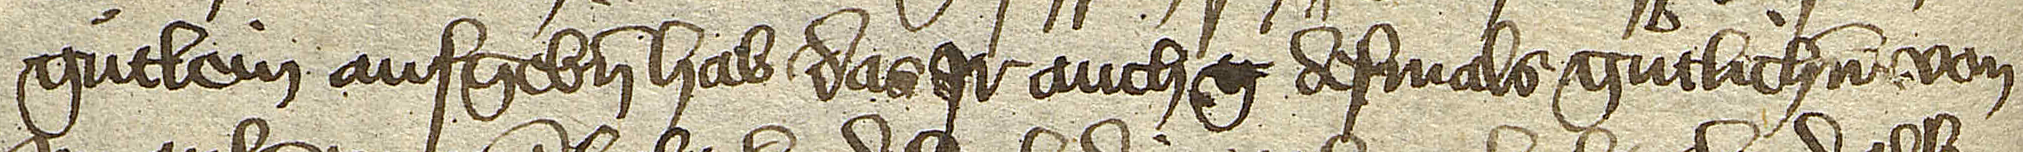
gütlein aufgebn* hab / das Ir auch g deſmals gütlichn* von
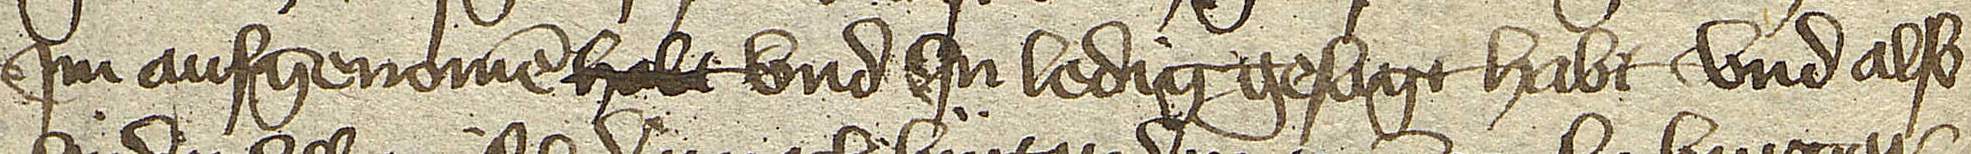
Im aufgenome* habt vnd In ledig geſagt habt / vnd alſo
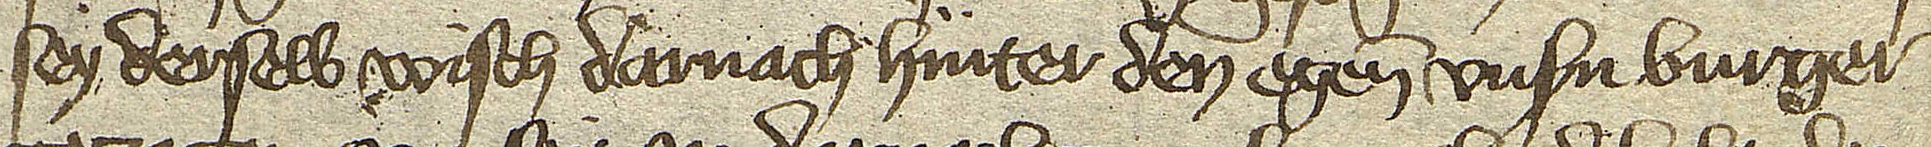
ſey derſelb wiſch darnach hinter den egen* vnſ*n burger
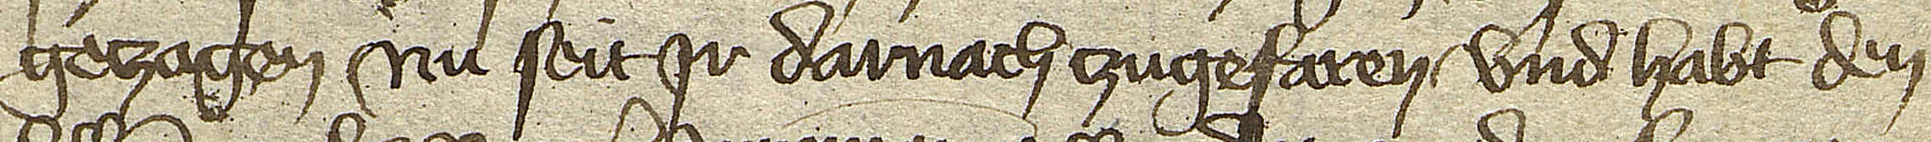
gecʒogen Nu ſeit Ir darnach cʒugefaren / vnd habt den
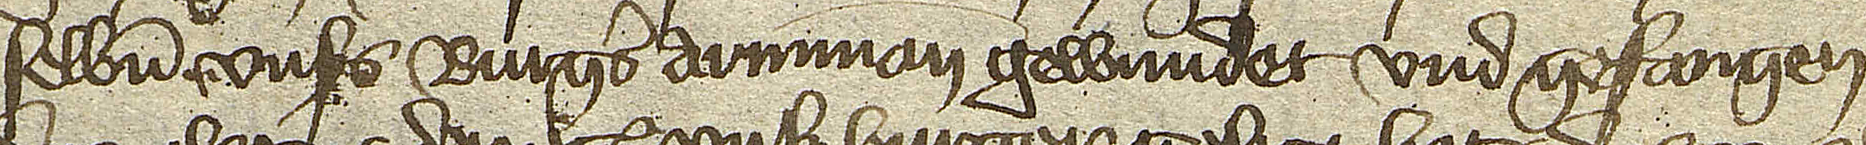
ſelbn* vnſ*s Burgs* Armman gewundet vnd gefangen
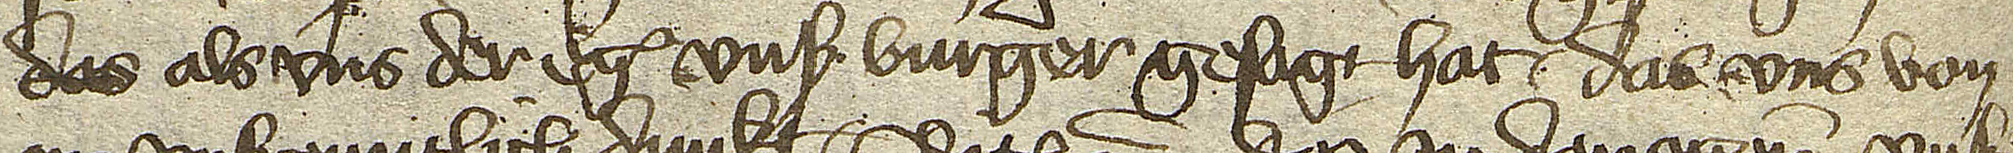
das als vns der eg* vnſ* burger geſagt hat / das vns von
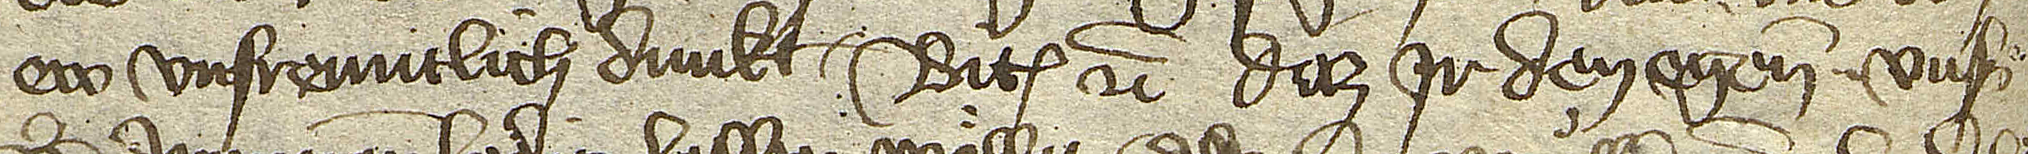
ew vnfreuntlich dunkt / Bit* ec* daʒ Ir den egen* ~ vnſ*s
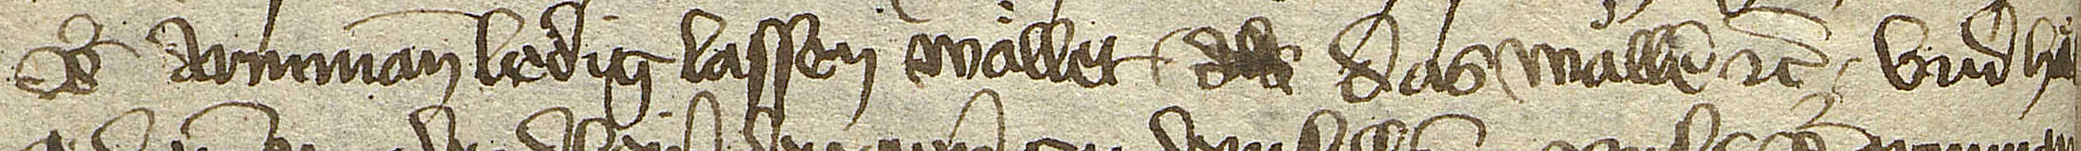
B* Armman ledig laſſen wöllet / Als Das wölle* ec* / vnd h%
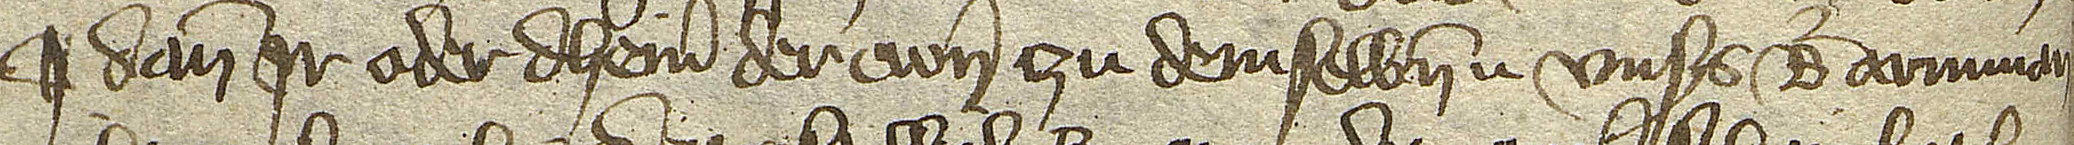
I dan* Ir oder dhein* der ewn* cʒu demſelbn* ~ vnſ*s B* armman
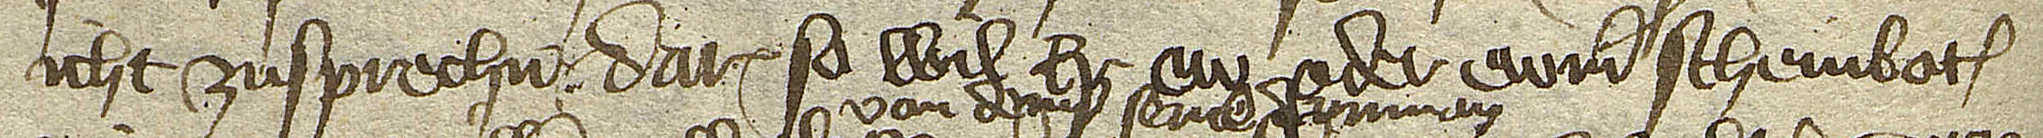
icht cʒuſprechn* / Dar* ſo wil Er ew oder ewm* ſcheinbot*
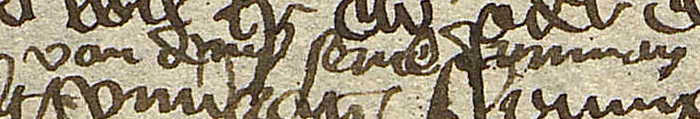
von demſ* ſeine* Armman
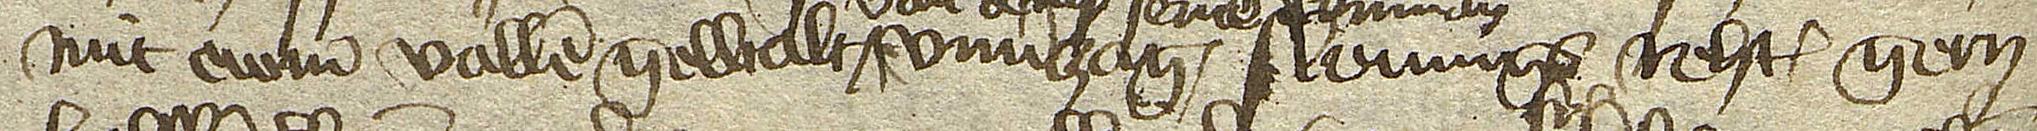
mit ewm* volle* gewalt vnu*ʒog* ſleunigs reht* gern
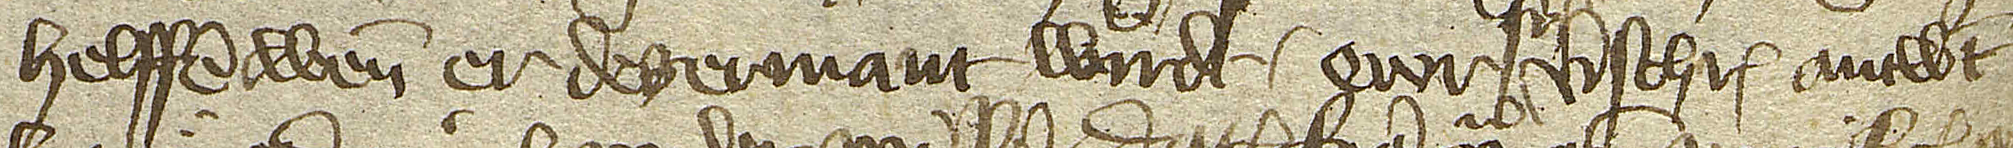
helffe* / wen* er des ermant wirdt / ewr v*ſchr* antw*t
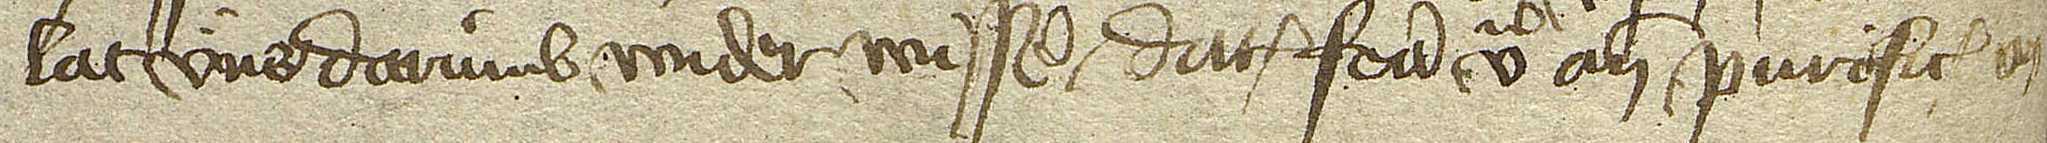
lat v̈ns darümb wider wiſſe* / dat* fea* v* an* purific* M
